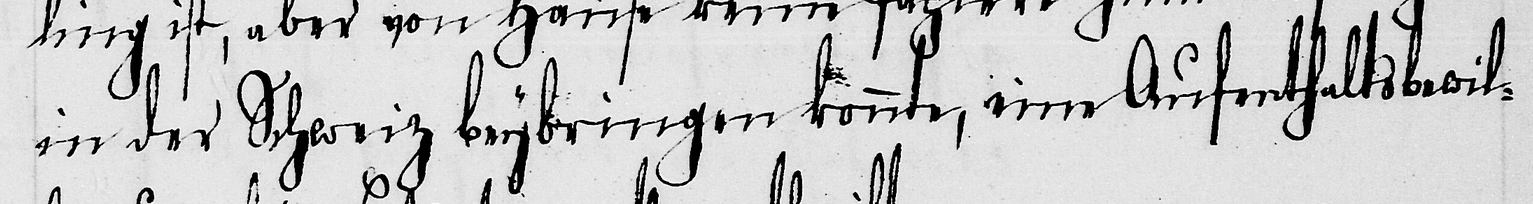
in der Schweiz beybringen konnte, eine Aufenthaltsbewil¬
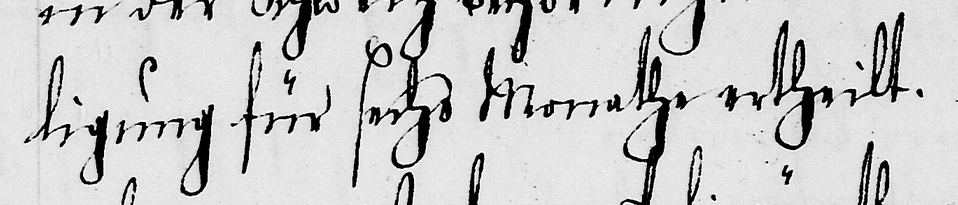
ligung für sechs Monathe ertheilt.
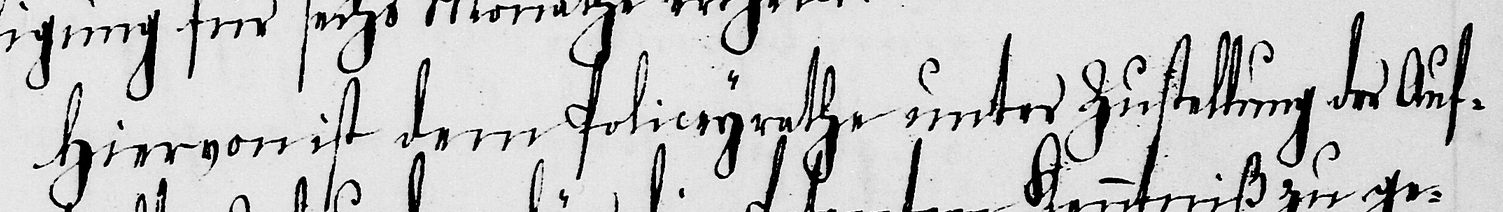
Hiervon ist dem Policeyrathe unter Zustellung der Auf¬
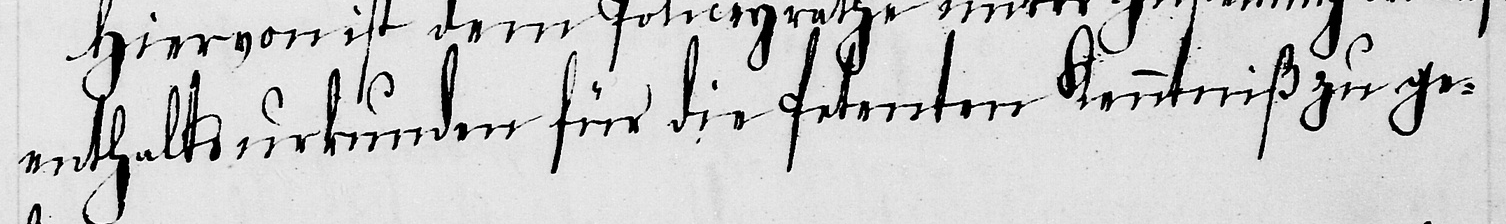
enthaltsurkunden für die Petenten Kenntniß zu ge¬
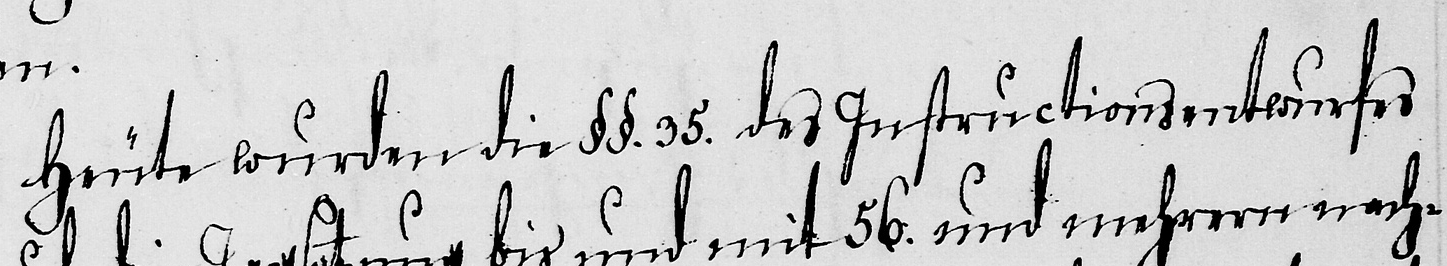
Heute wurden die §§. 35 des Instructionsentwurfes
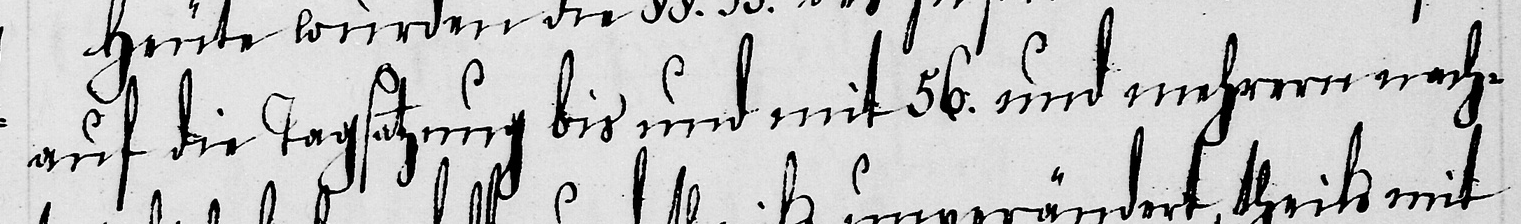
auf die Tagsatzung bis und mit 56. und mehrern nacht¬
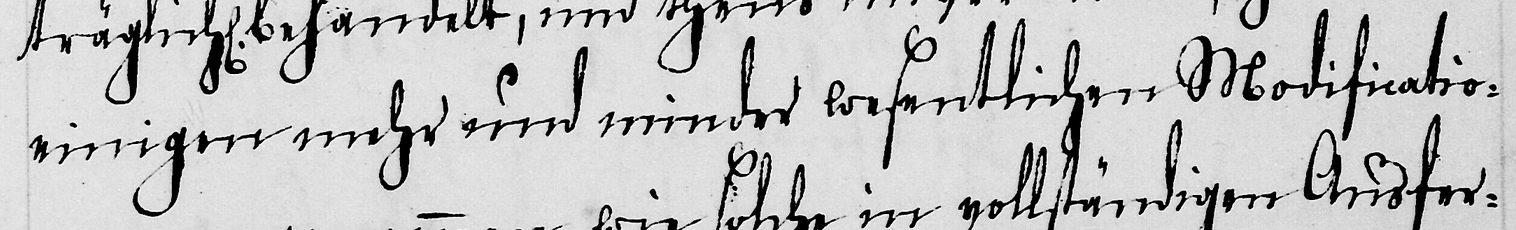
einigen mehr und minder wesentlichen Modificatio¬
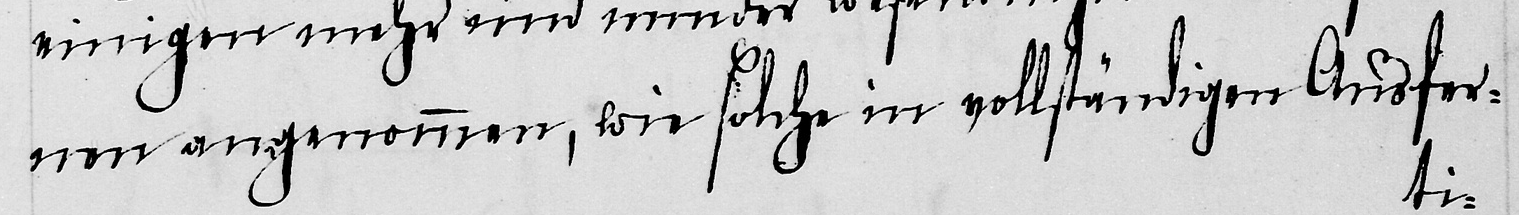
nen angenommen, wie solche in vollständigen Ausfer-
